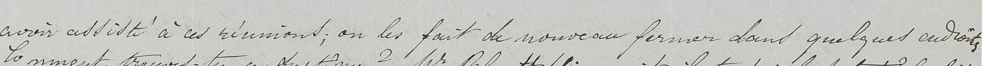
avoir assisté à ces réunions; on les fait de nouveau fermer dans quelques endroits.
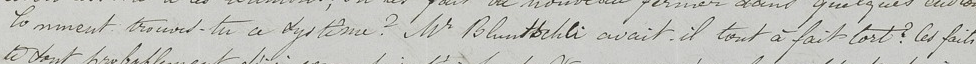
Comment trouves-tu ce système? MrBluntschli avait-il tout à fait tort? Ces faits
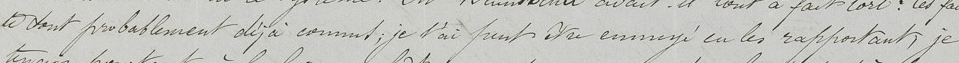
te sont probablement déjà connus, je t'ai peut-être ennuyé en les rapportant, je
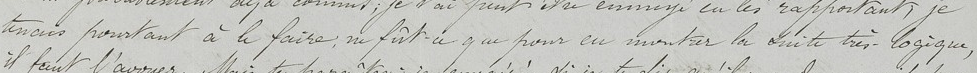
tenais pourtant à le faire; ne fût-ce que pour en montrer la suite très-logique,
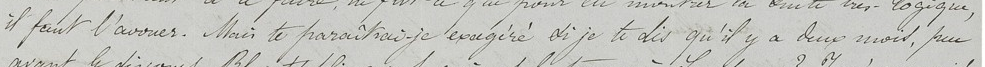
il faut l'avouer. Mais te paraîtrai-je exagéré si je te dis qu'il y a deux mois, peu
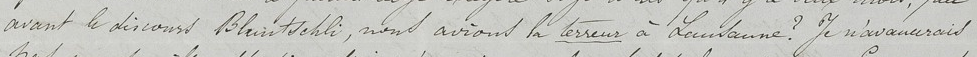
avant le discours Bluntschli, nous avions la terreur à Lausanne? Je n'avancerais
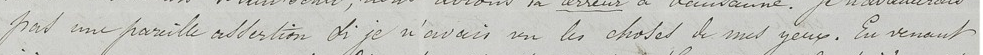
pas une pareille assertion si je n'avais vu les choses de mes yeux. En venant
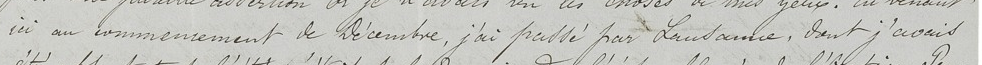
ici au commencement de Décembre, j'ai passé par Lausanne, dont j'avais
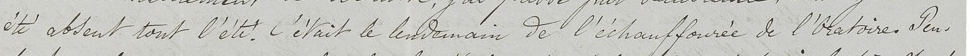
été absent tout l'été! C'était le lendemain de l'échauffourée de l'Oratoire. Pen-
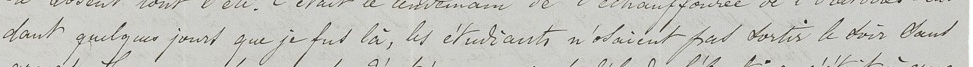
dant quelques jours que je fus là, les étudiants n'osaient pas sortir le soir sans
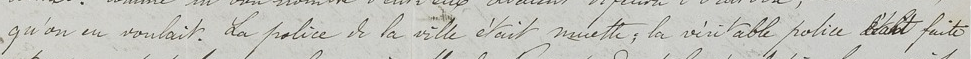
qu'on en voulait. La police de la ville était muette; la véritable police était faite
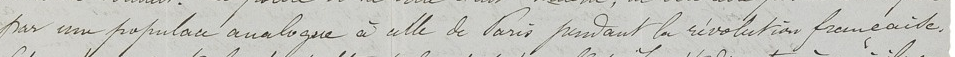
par une populace analogue à celle de Paris pendant la révolution française.
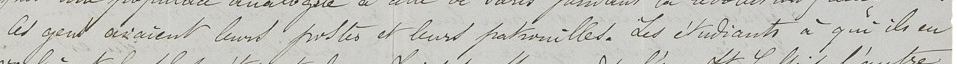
Ces gens avaient leurs postes et leurs patrouilles. Les étudiants à qui ils en
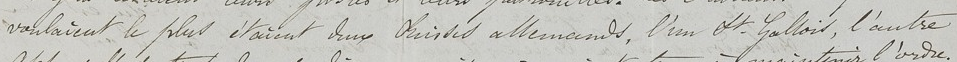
voulaient le plus étaient deux Suisses allemands, l'un St. Gallois, l'autre
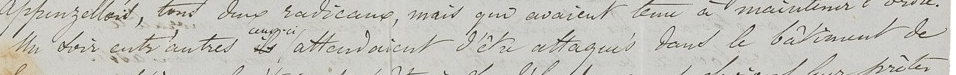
Un soir entr'autres ilsceux-ci attendaient d'être attaqués dans le bâtiment de
